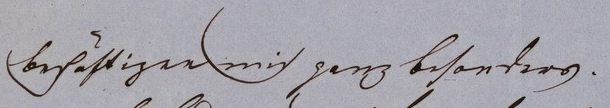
beschäftigen mich ganz besonders.
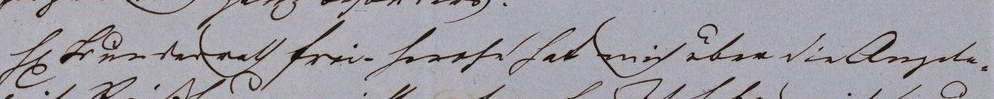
Herr Bundesrath Frei-Herosé hat mich über die Angele-
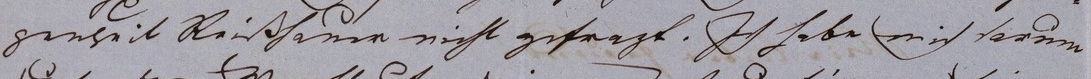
genheit Reißhauer nicht gefragt. Ich habe mich darum
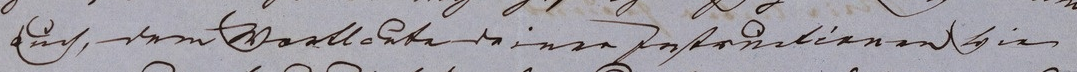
auch, dem Wortlaute Deiner Instructionen wie
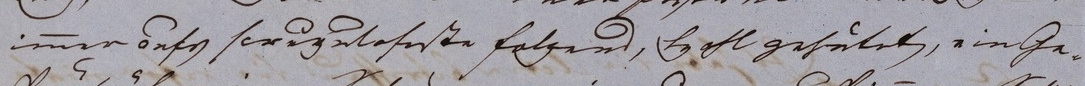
immer aufs scrupuloseste folgend, wohl gehütet, ein Ge-
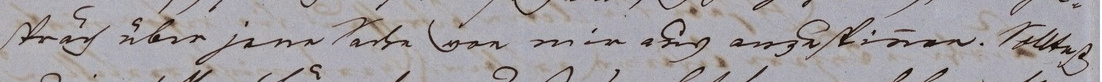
spräch über jene Sache von mir aus anzuspinnen. Solltest
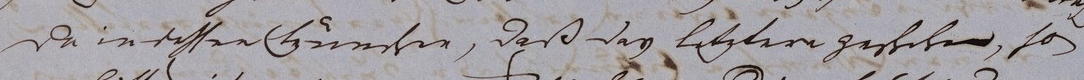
du indessen wünschen, daß das letztere geschehe, so
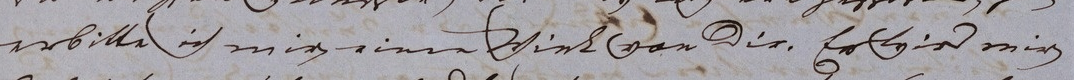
erbitte ich mir einen Wink von Dir. Er wird mir
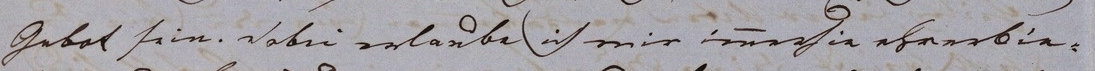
Gebot sein. Dabei erlaube ich mir immerhin ehrerbie-
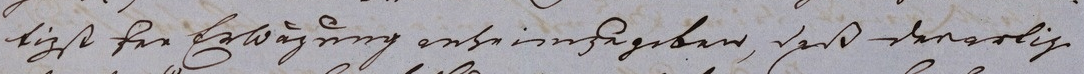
tigst zur Erwägung anheimzugeben, daß derartige
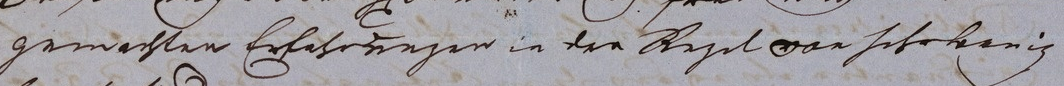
gemachten Erfahrungen in der Regel von sehr wenig
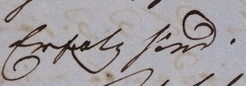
Erfolg sind.
